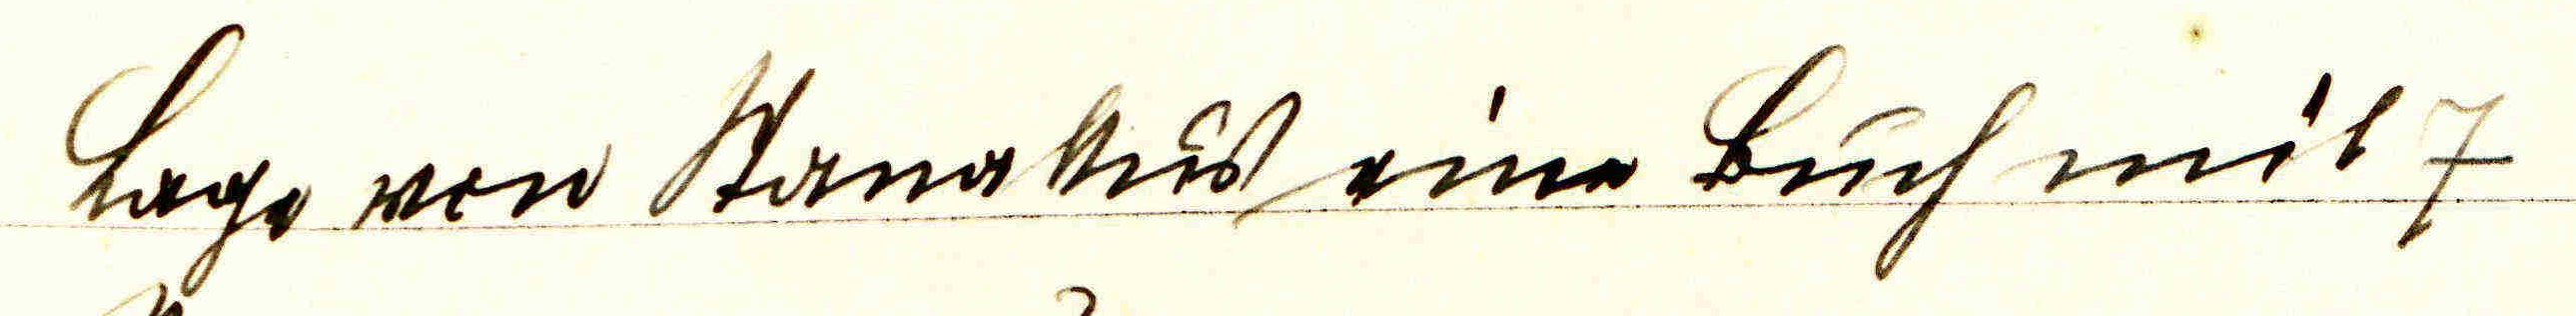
Lage von Stanakus ein Buch mit 7
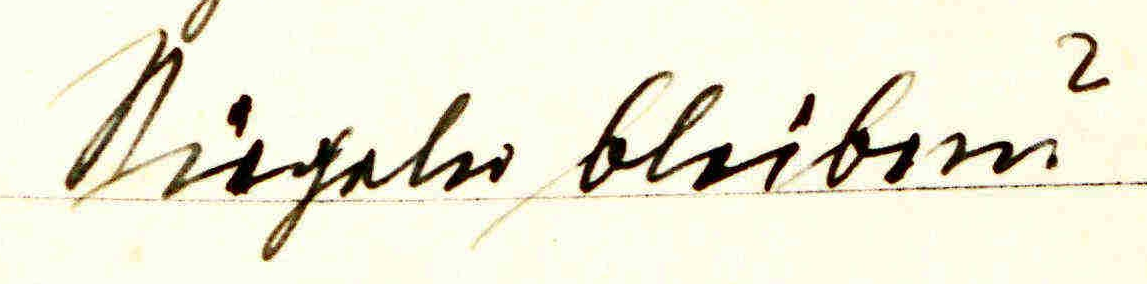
Siegeln bleiben?
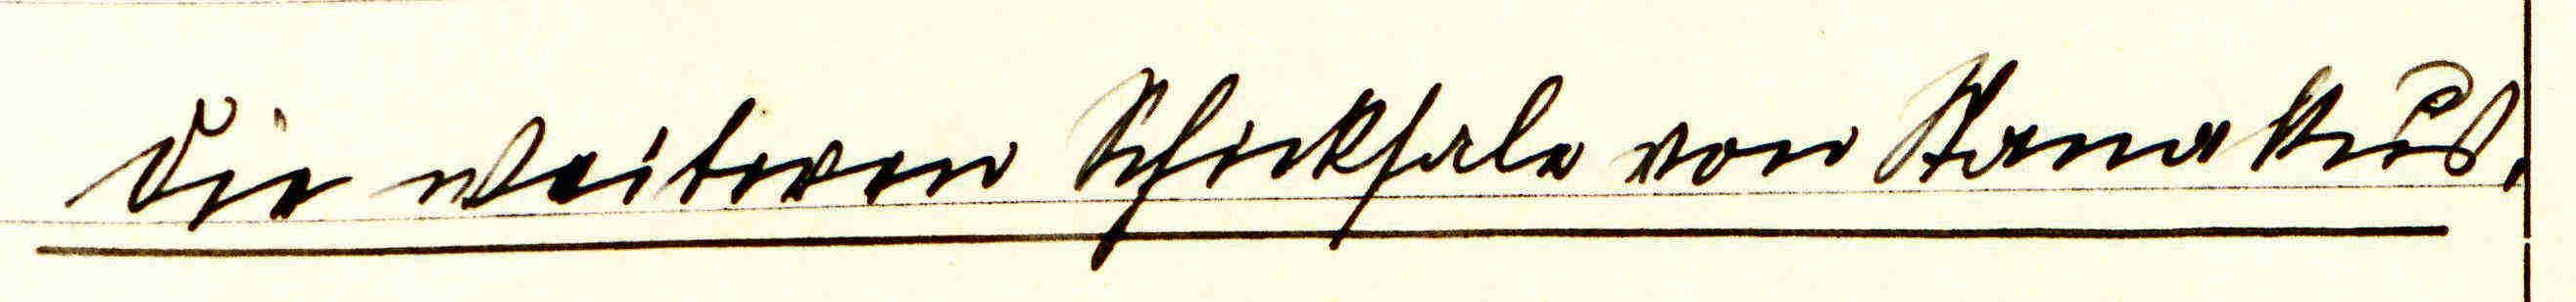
Die weiteren Schicksale von Stanakus:
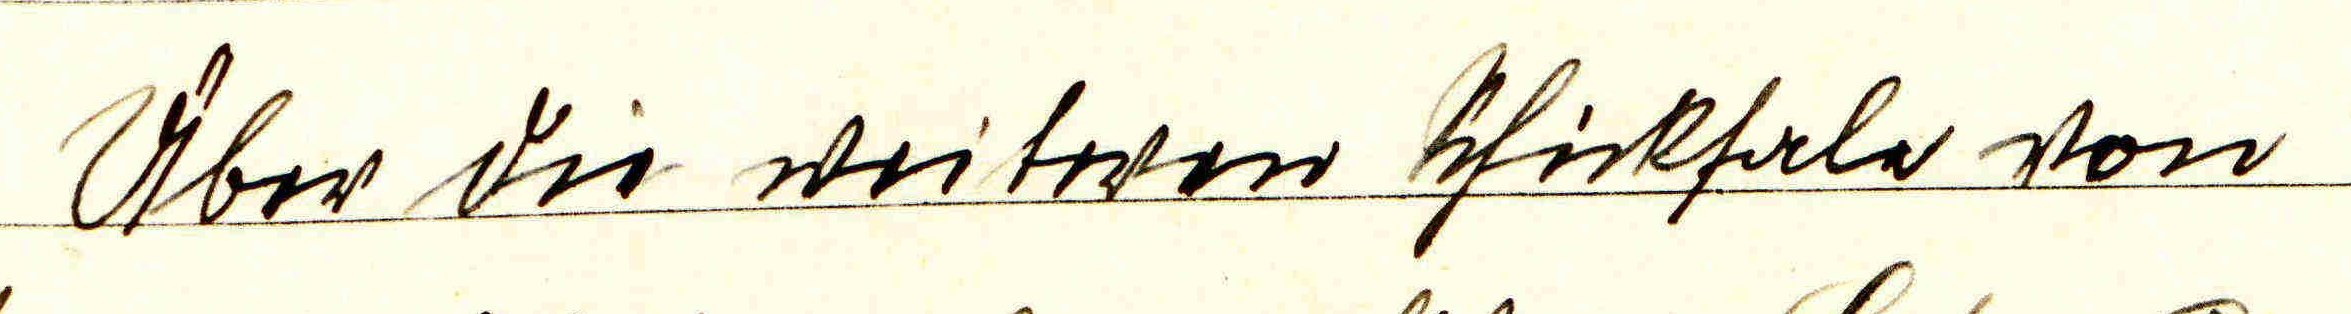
Über die weiteren Schicksale von
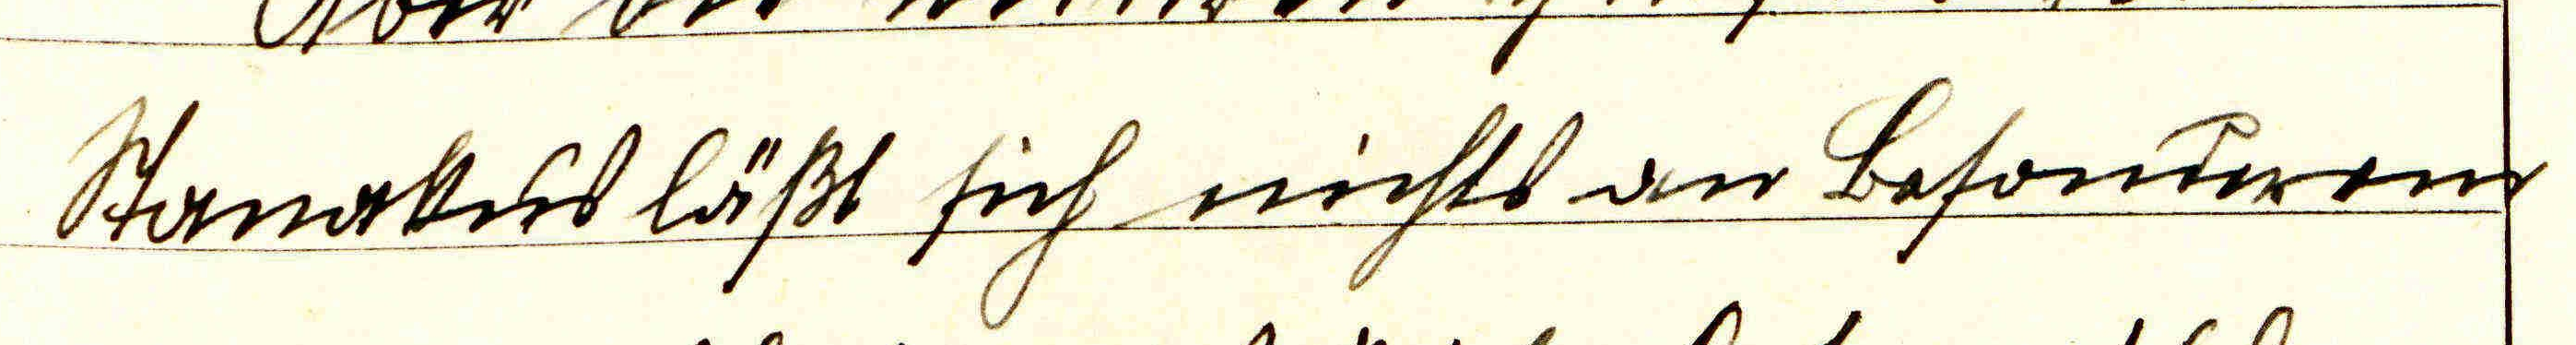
Stanakus läßt sich nichts an Besonderem
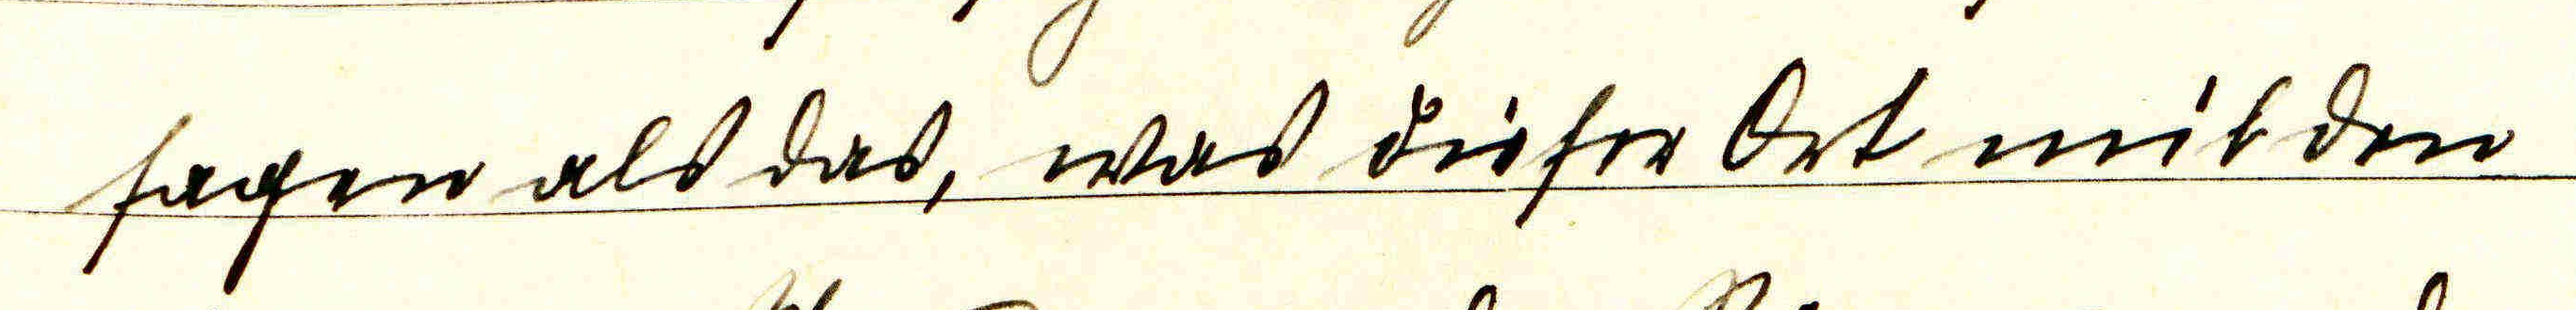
sagen als das, was sieser Ort mit den
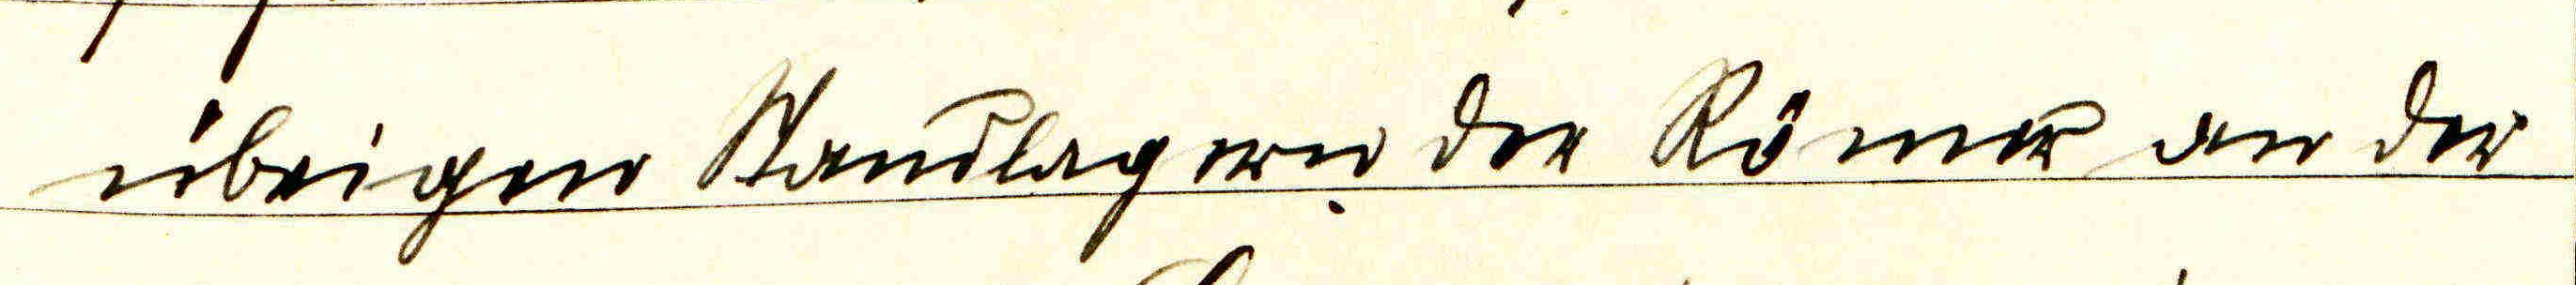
übrigen Standlagern der Römer an der
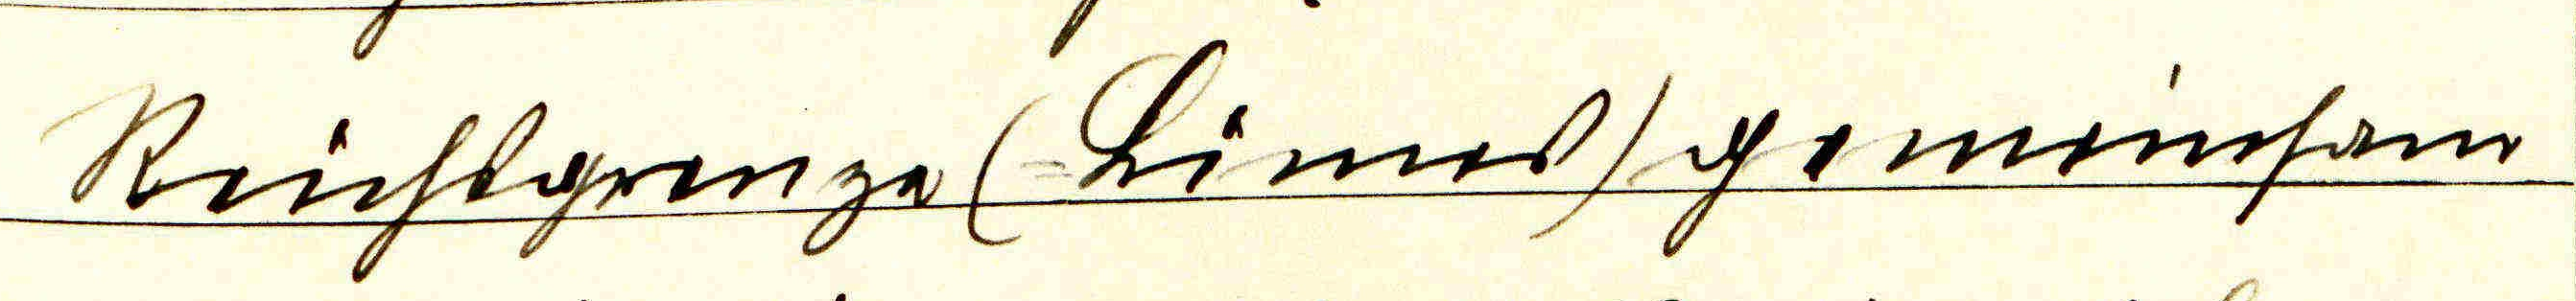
Reichsgrene =(Limes) gemeinsam
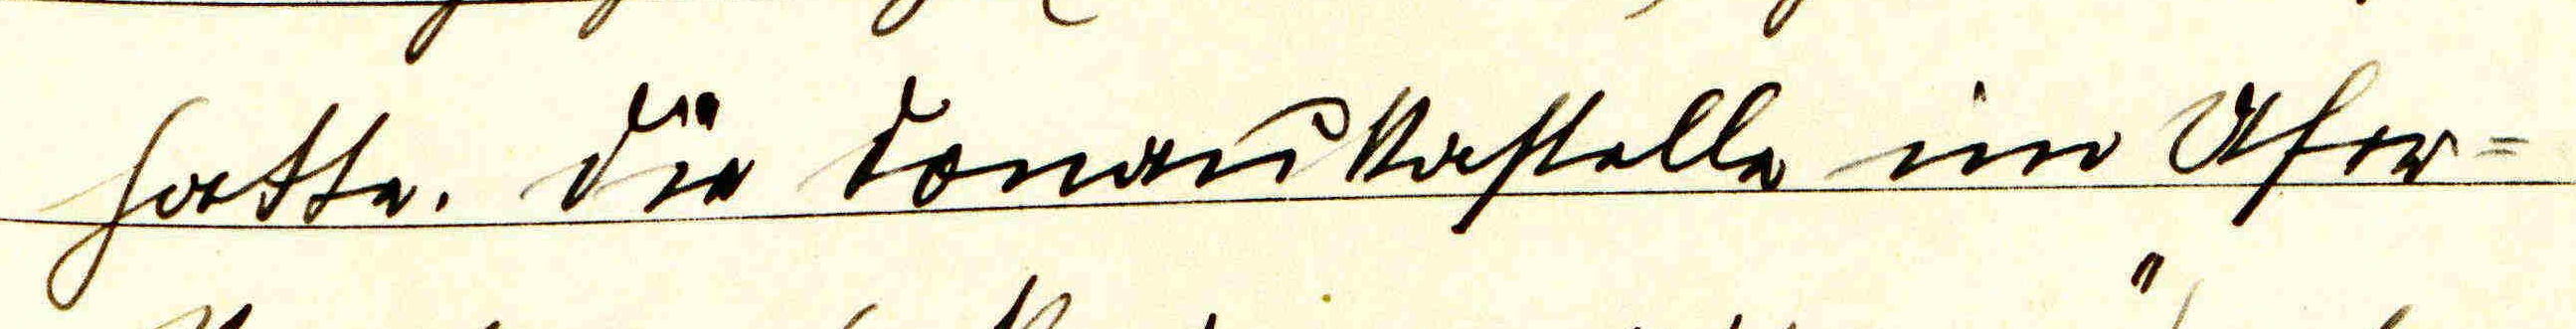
hatte. Die Donaukastelle im Ufer-
